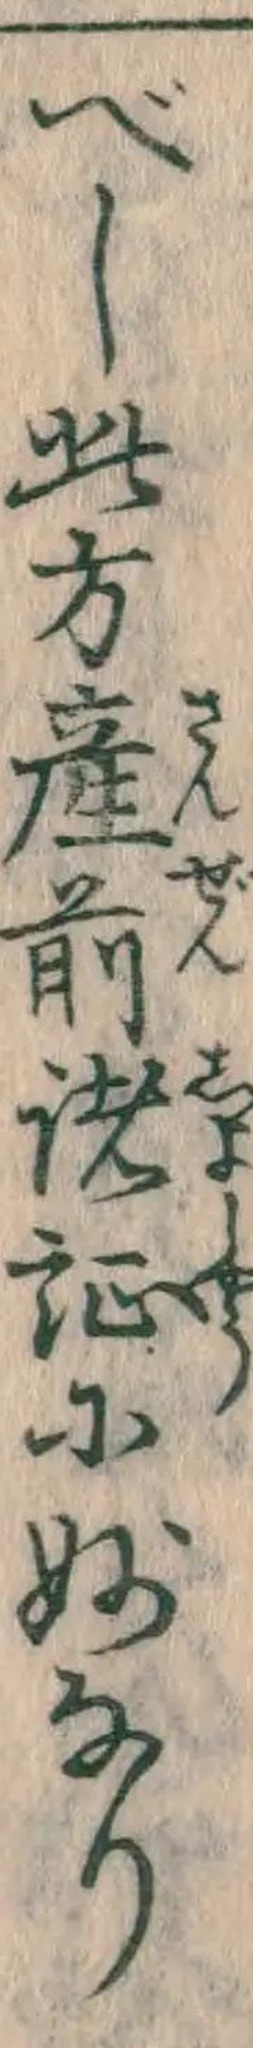べし此方産前諸証に妙なり
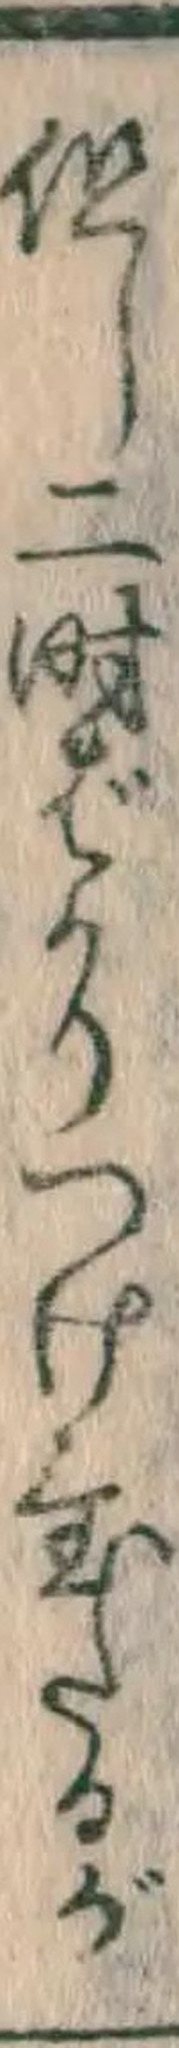但し二時ばかりつけ置たるが
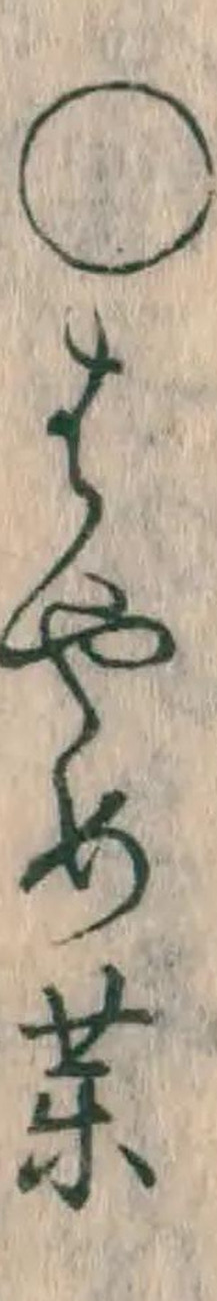○はやめ薬
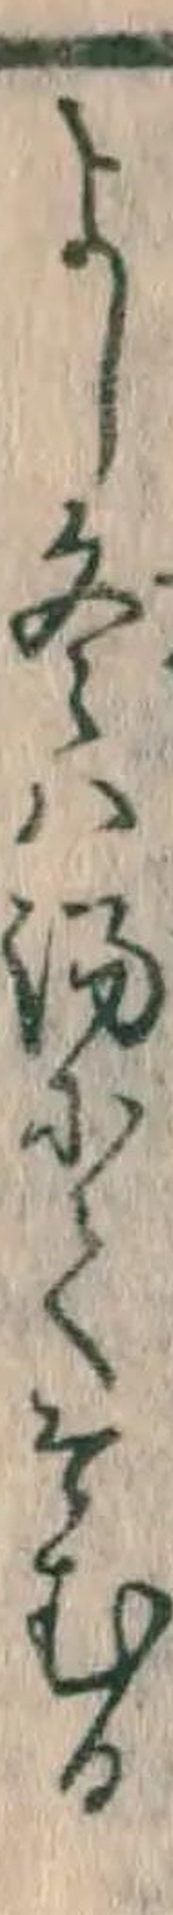よし冬は湯にてそむる
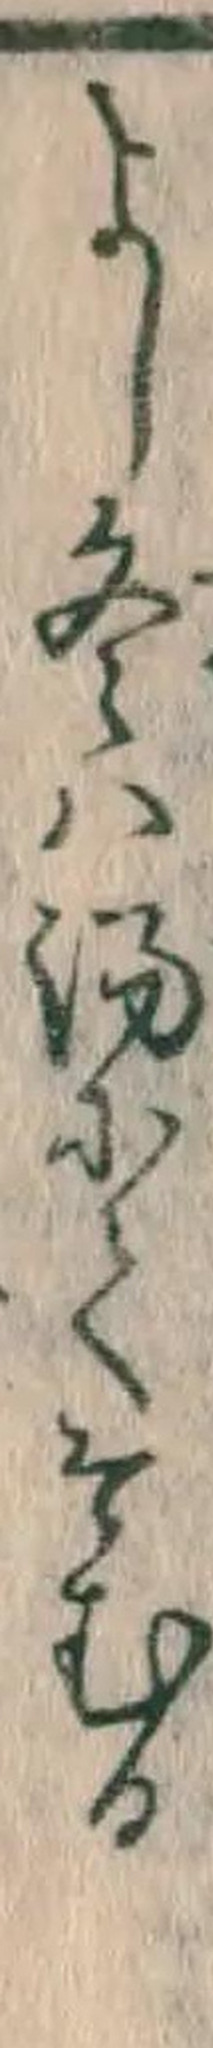よし冬は湯にてそむる
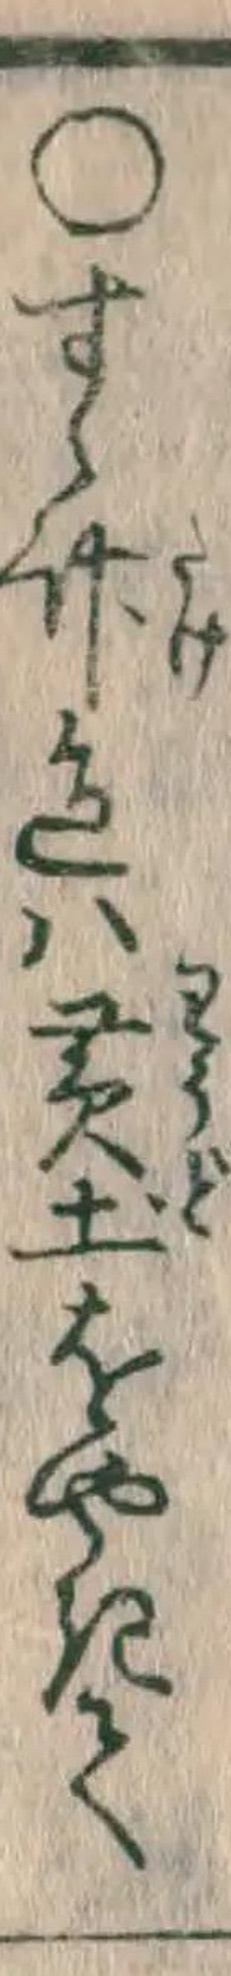○すす竹色は黄土をやきて
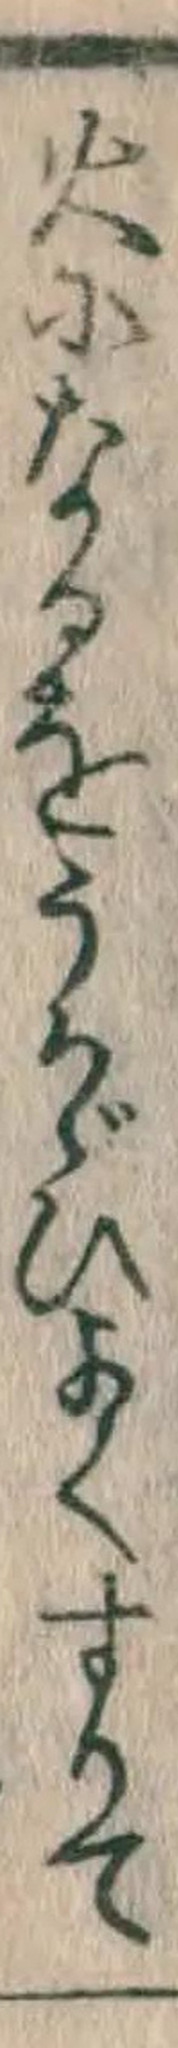火になるをうかゞひよくすりて
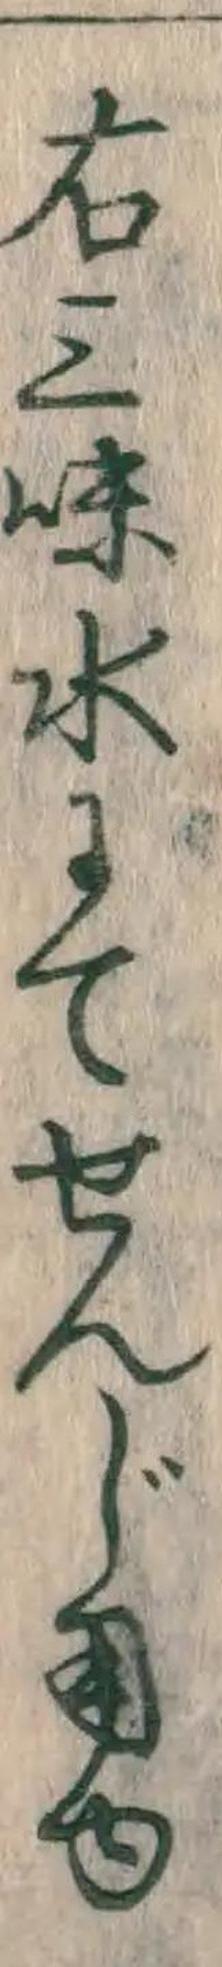右三味水にてせんじ用ゆ
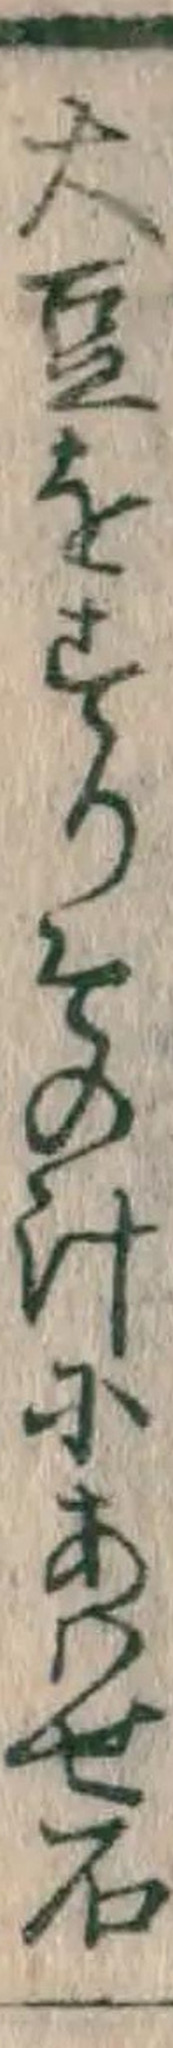大豆をすりその汁にあはせ石
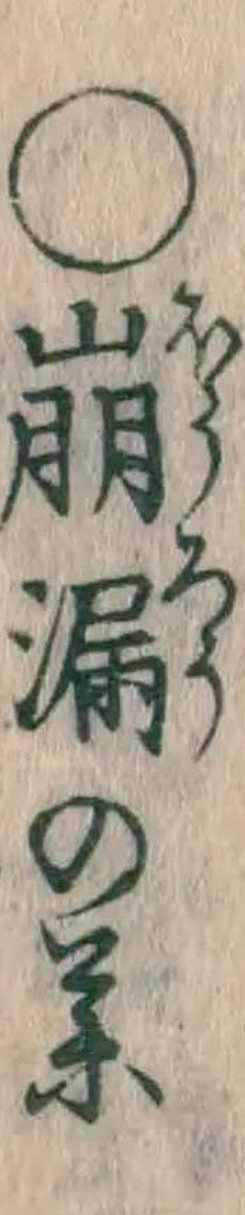○崩漏の薬
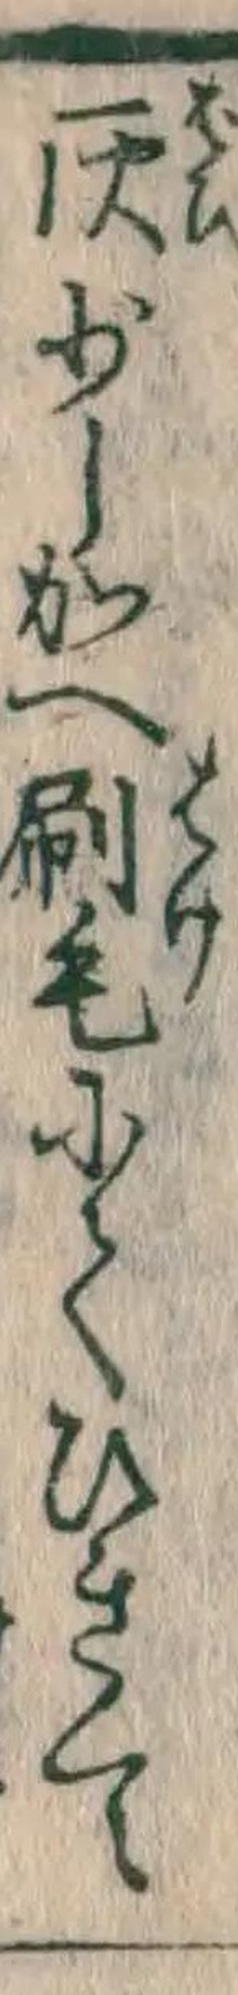灰少し加へ刷毛にてひきて
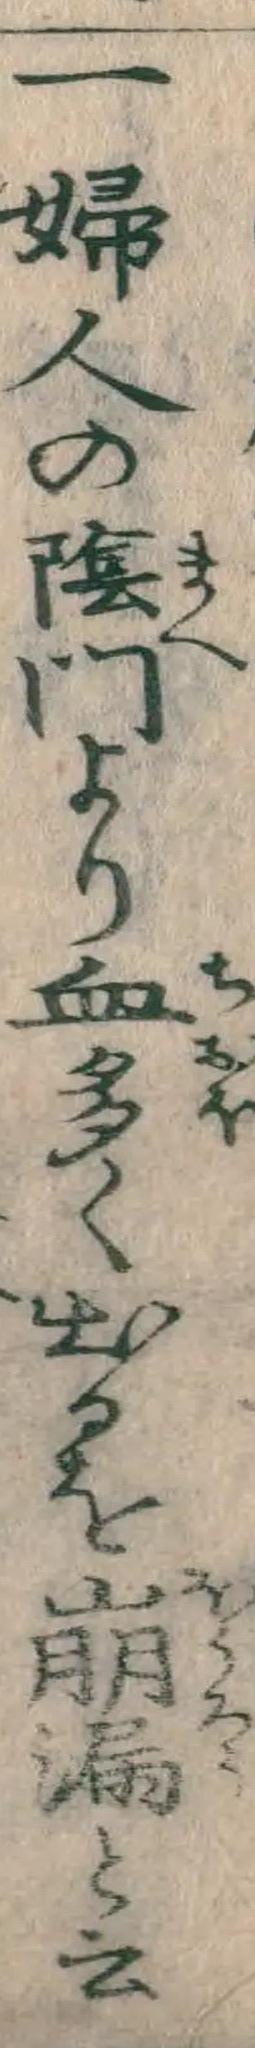一婦人の陰門より血多く出るを崩漏と云
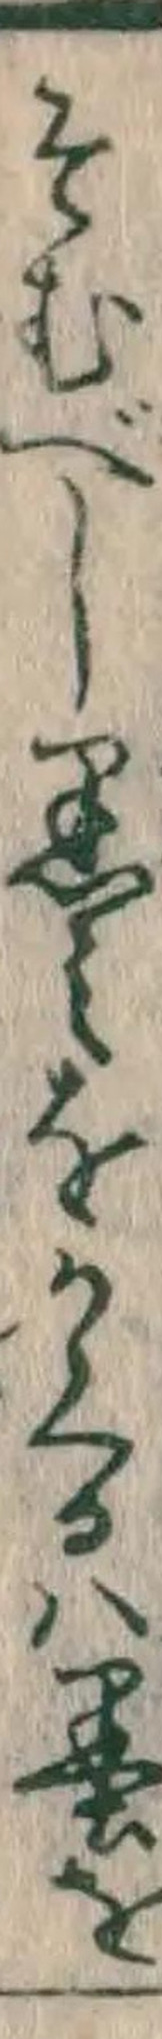そむべし黒みをかくるは墨を
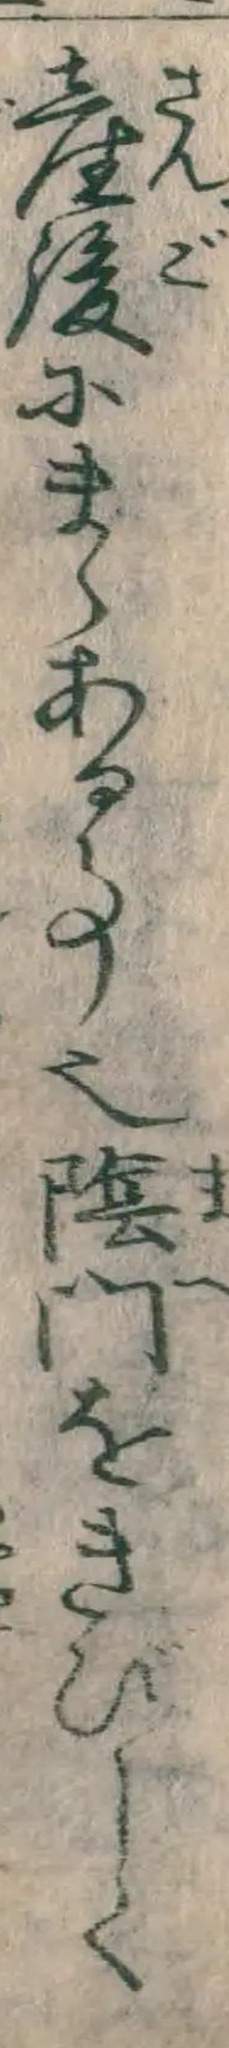産後にまゝある事也陰門をきびしく
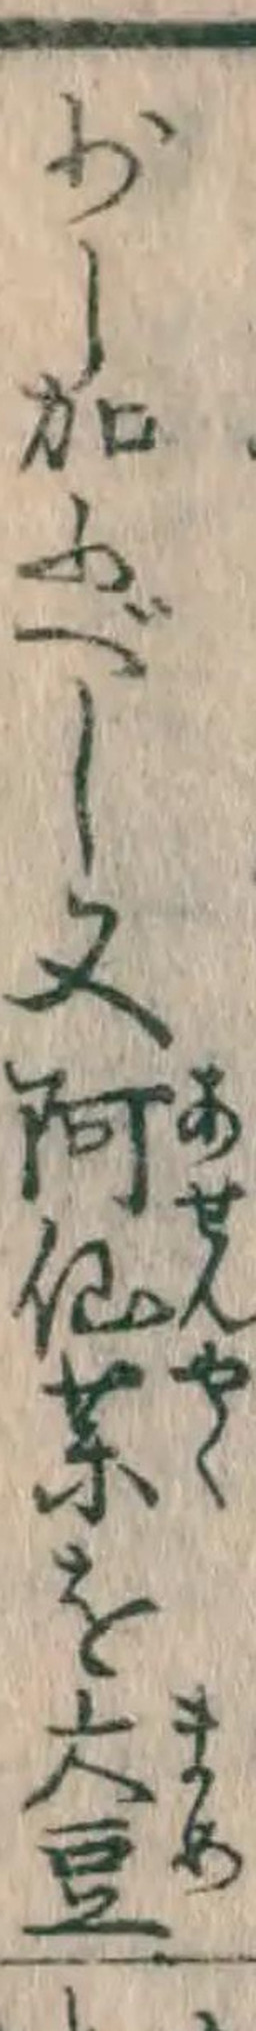少し加ふべし又阿仙薬を大豆
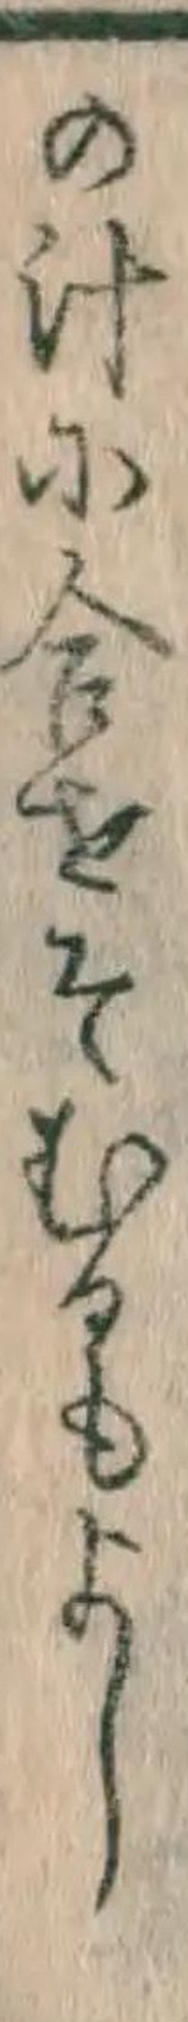の汁に合せそむるもよし
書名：広益秘事大全 3巻. [3]
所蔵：国立国会図書館 National Diet Library, JAPAN
